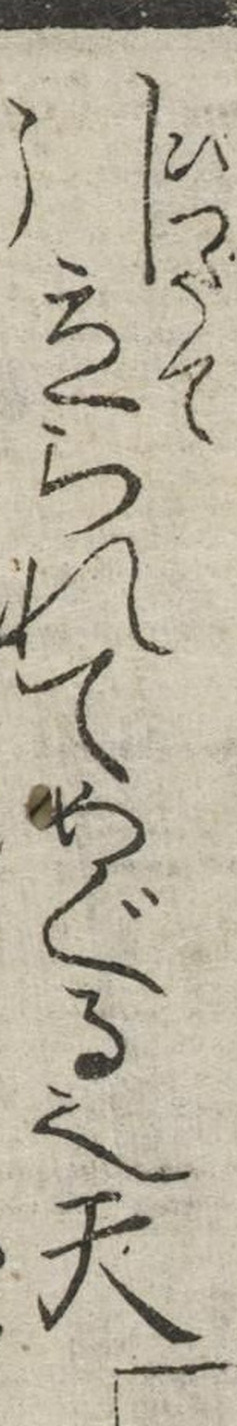引立られてめぐる也天
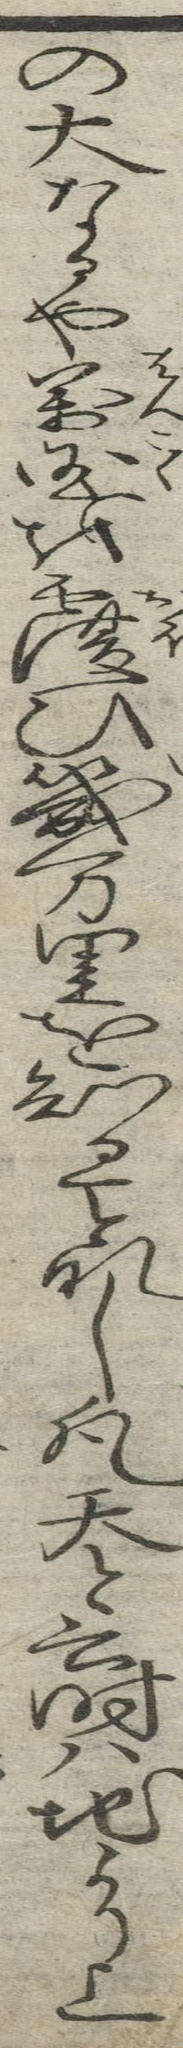の大なるや万国を覆ひ幾万里を知ることなし凡天と云時は地より上
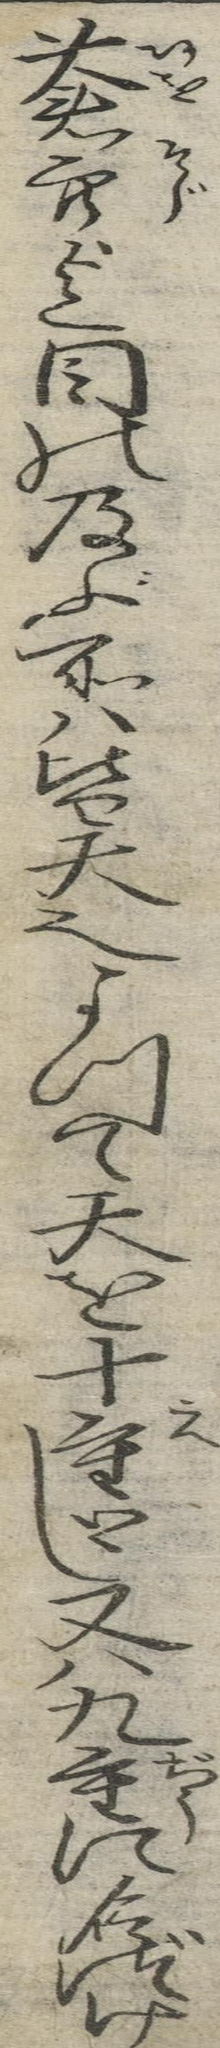蒼天迄目の及ぶ所は皆天也よつて天を十重とし又は九重に名づけ

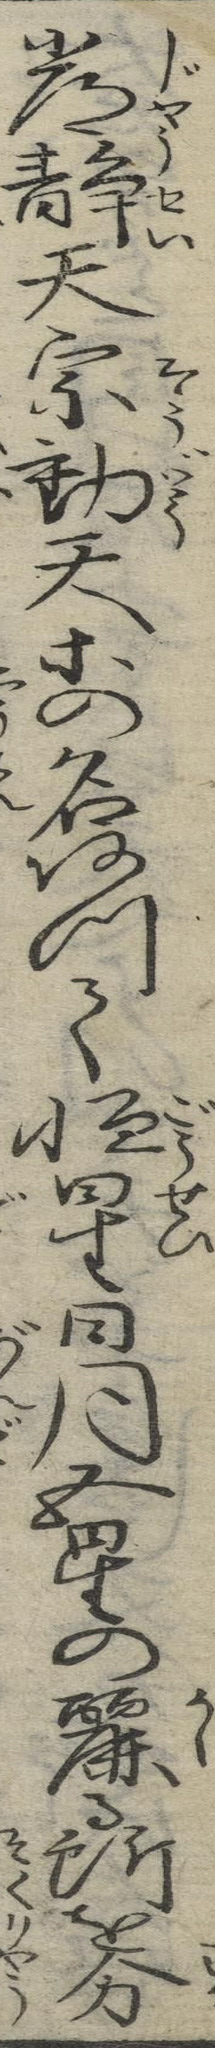常静天宗動天等の名あつて恒星日月五星の麗る所を分
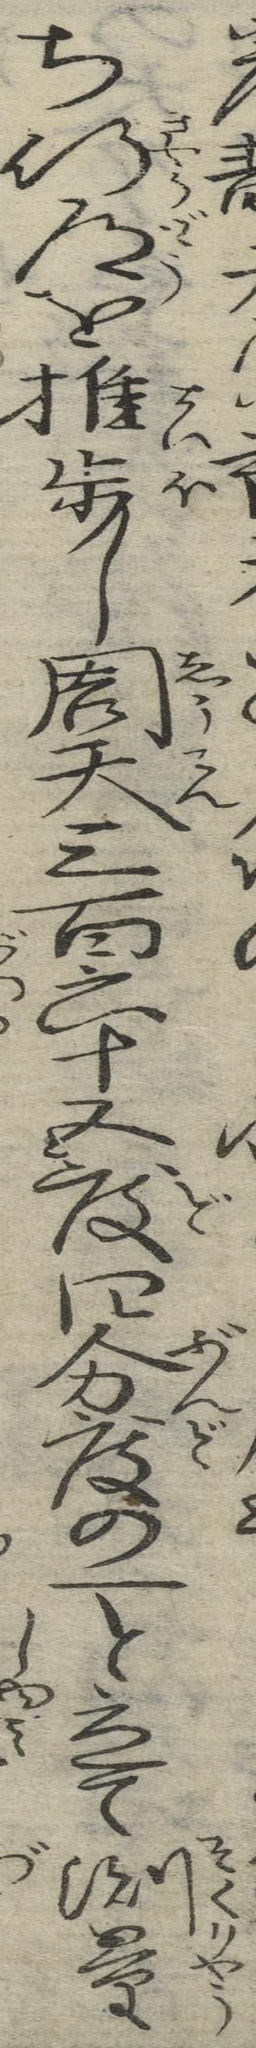ち行道を推歩し周天三百六十五度四分度の一と立て測量
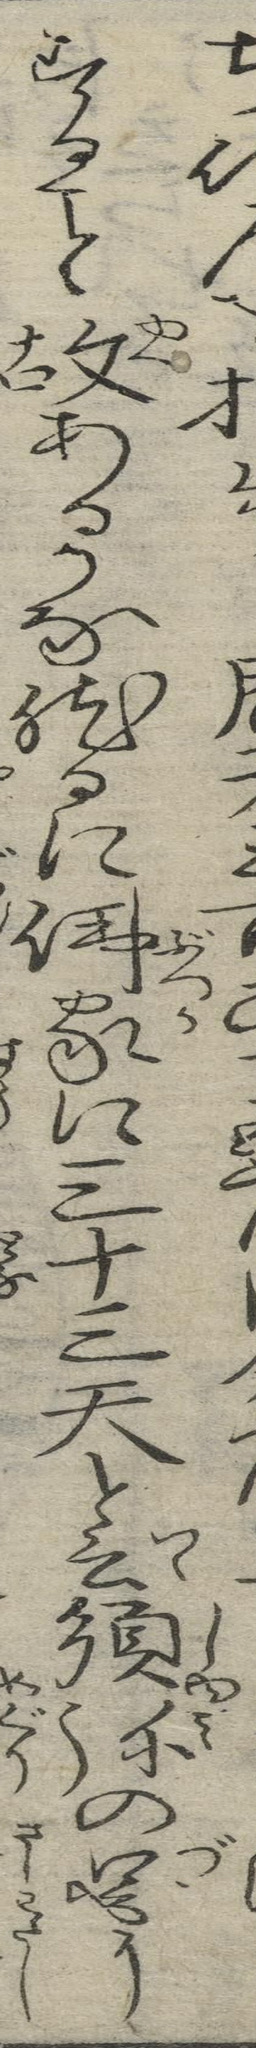すること故あるかな然るに仏家に三十三天と云須弥の図に
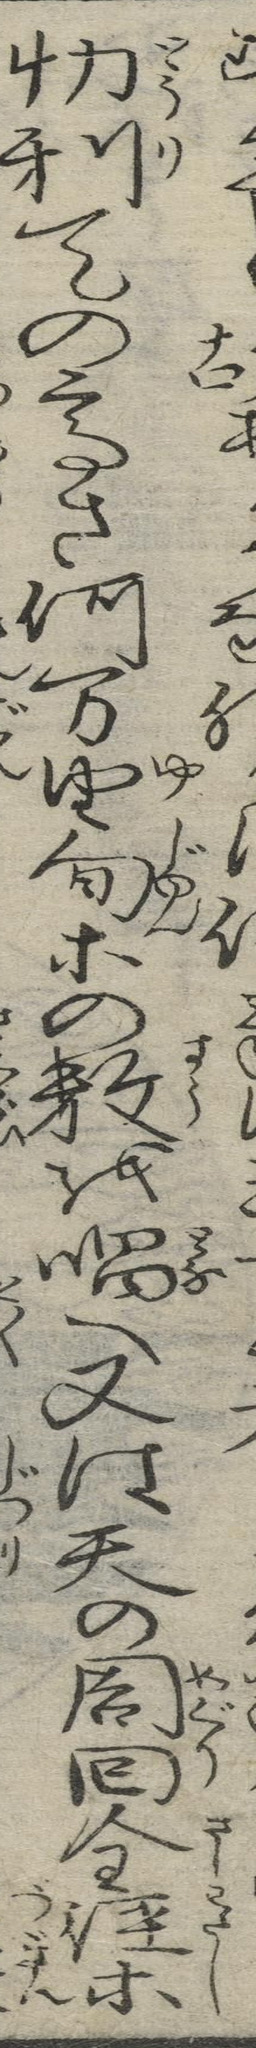忉利天の高さ何万由旬等の数を唱へ又は天の周回全経等
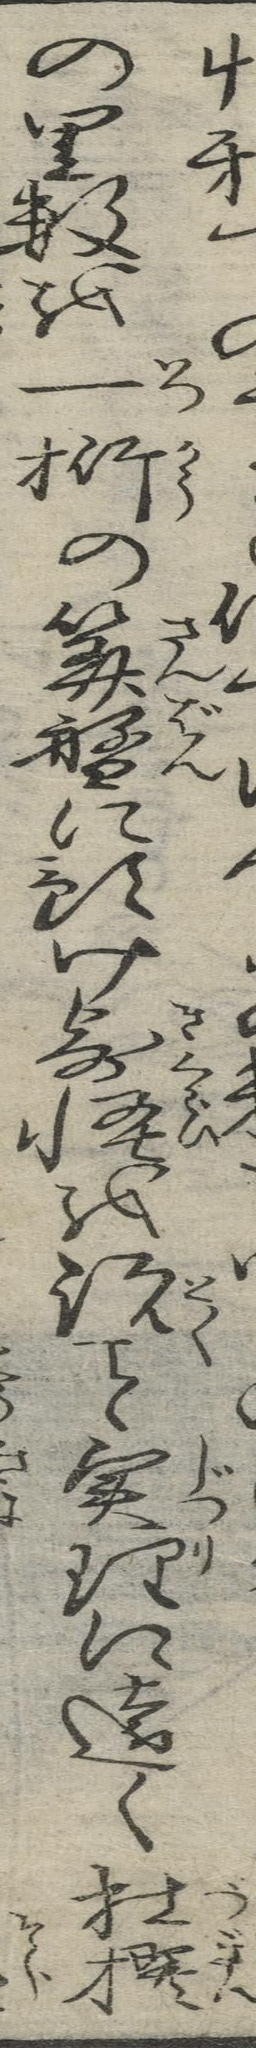の里数を一桁の算盤に預け奇怪を説こと実利に遠く杜撰
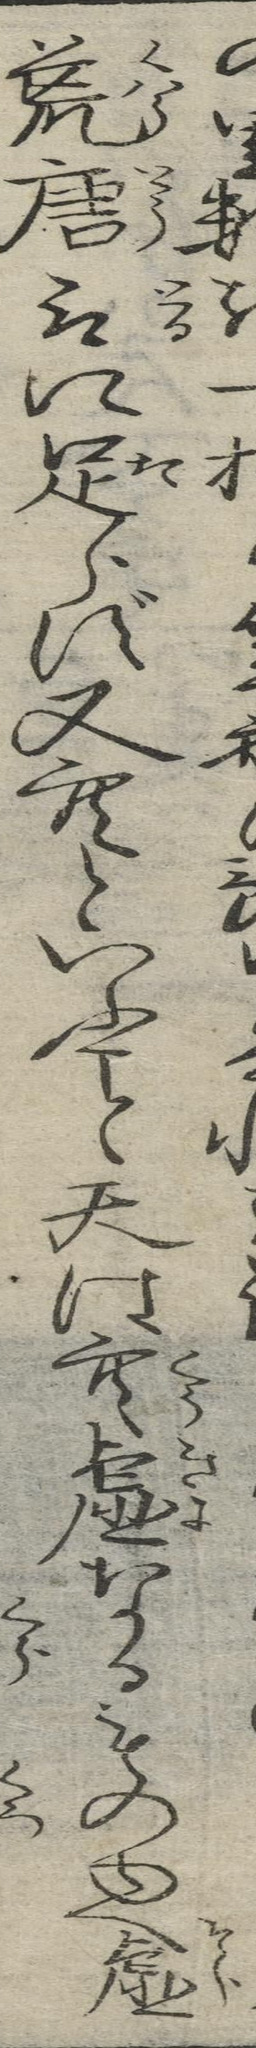荒唐取に足らず又空といふこと天は空虚なるものゆへ虚
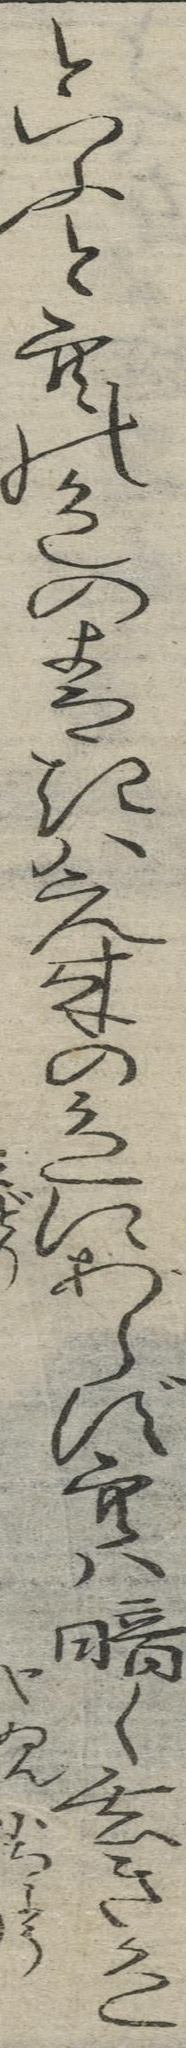といふと空の色の青きは元来の色にあらず空は暗し玄き色
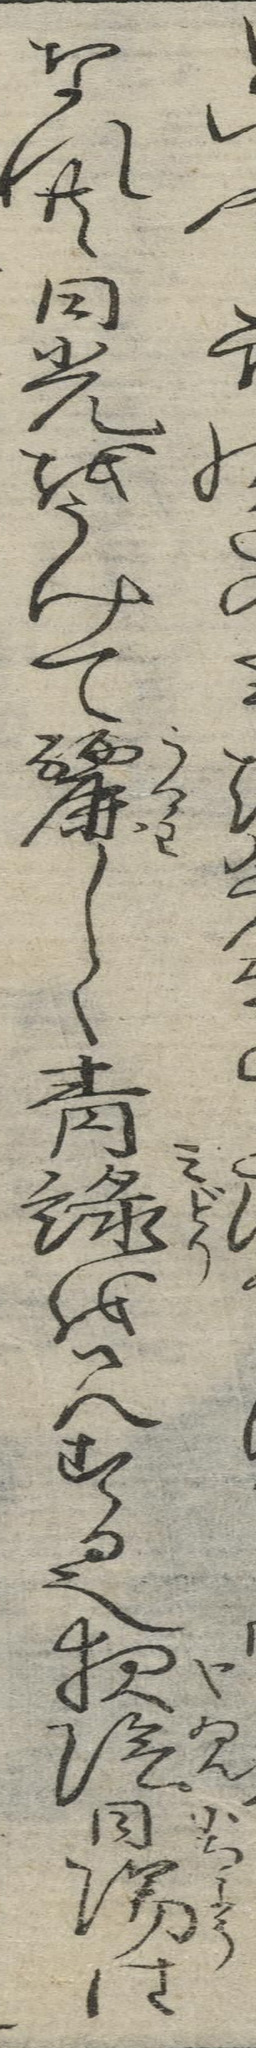なれ共日光をうけて麗しく青緑をみする也夜陰日陽は
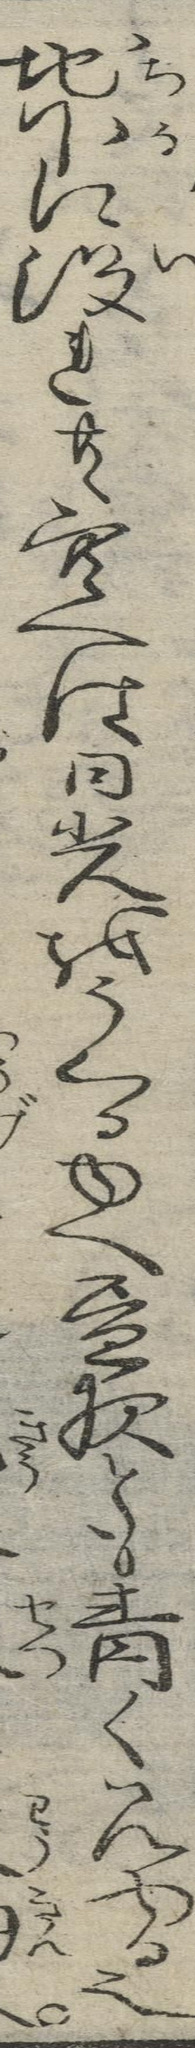地下に没れ共空へは日光をうくるゆへ昼夜とも青く見ゆる也
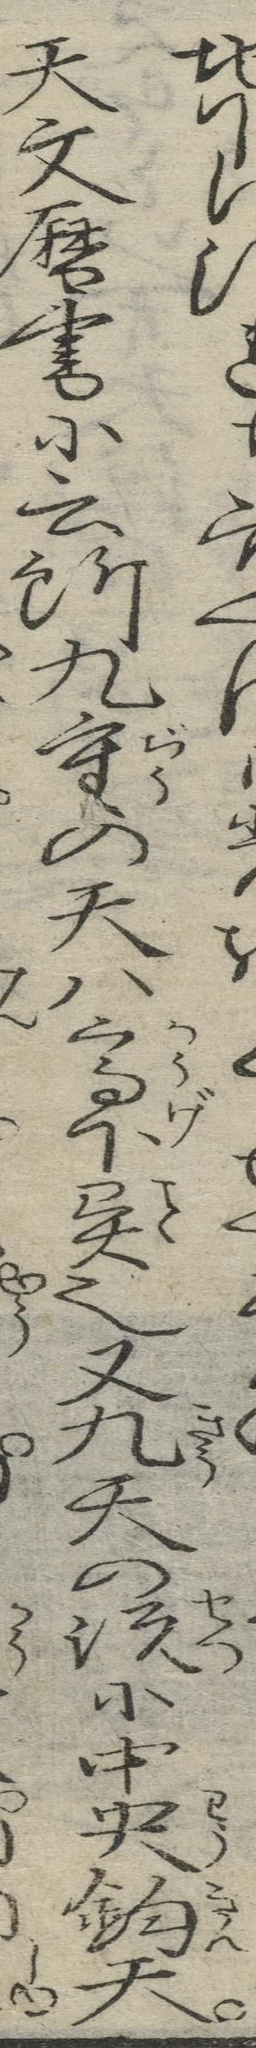天文暦書に云所九重の天は高下異也又九天の説に中央鈞天。
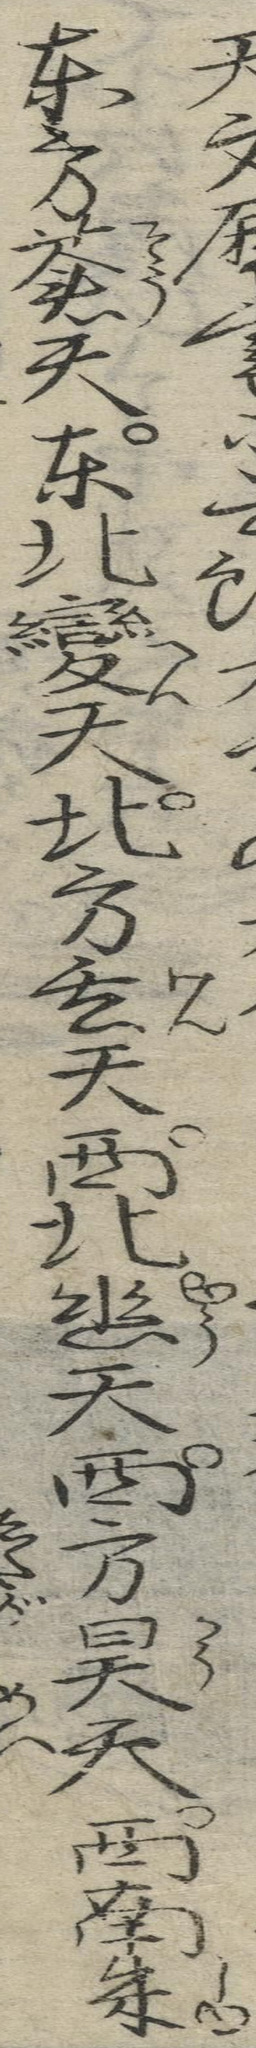東方蒼天。東北変天。北方玄天。西北幽天。西方昊天。西南朱
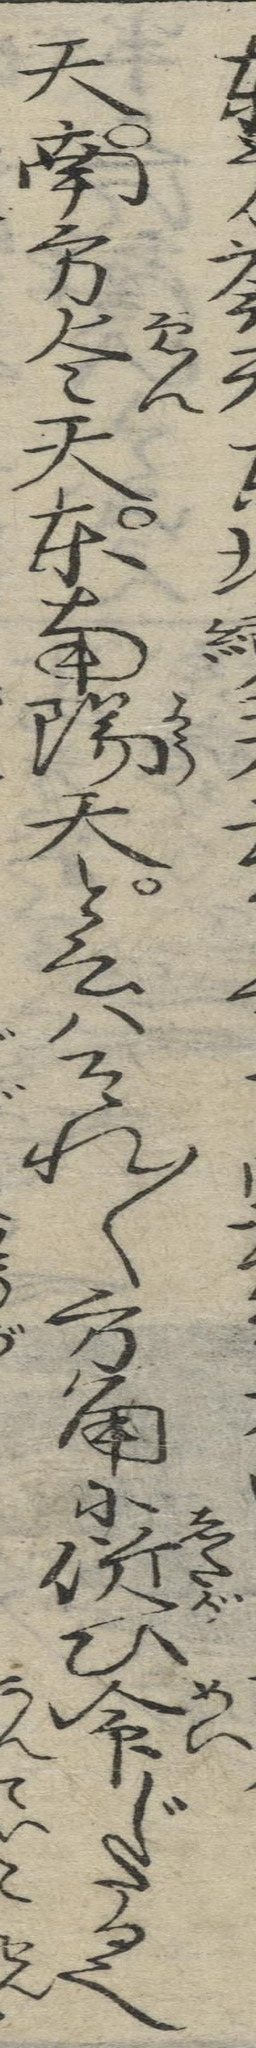天。南方炎天。東南陽天。と云はそれ〳〵方角に従ひ命じたる也
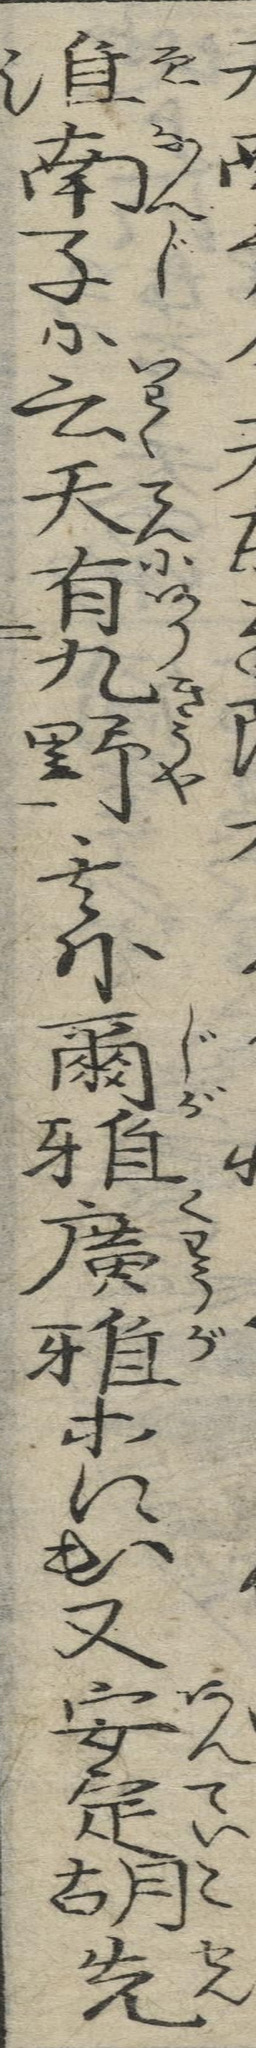淮南子に云天有九野其外爾雅広雅等にも又安定胡先
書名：訓蒙天地辨　天
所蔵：東京大学地震研究所図書室 Earthquake Research Institute Library, The University of Tokyo, JAPAN
